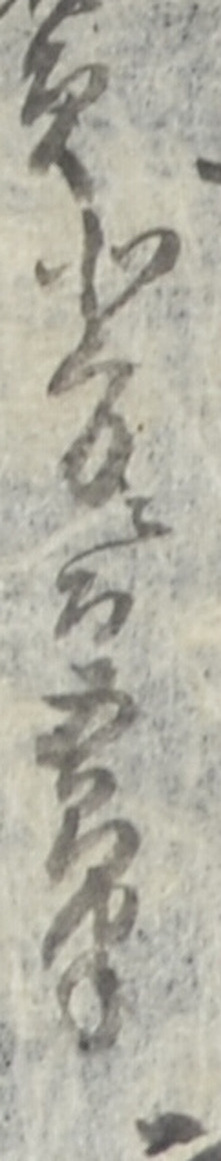南方ニ而五間半
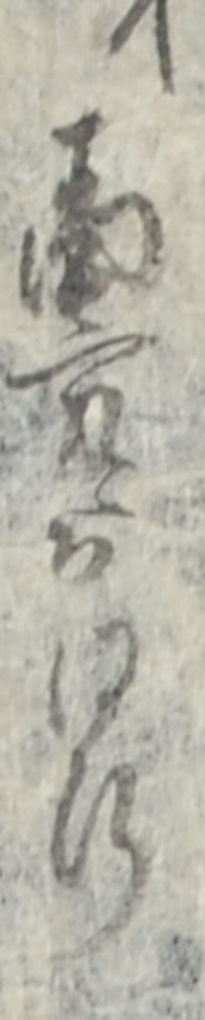南方ニ而同断
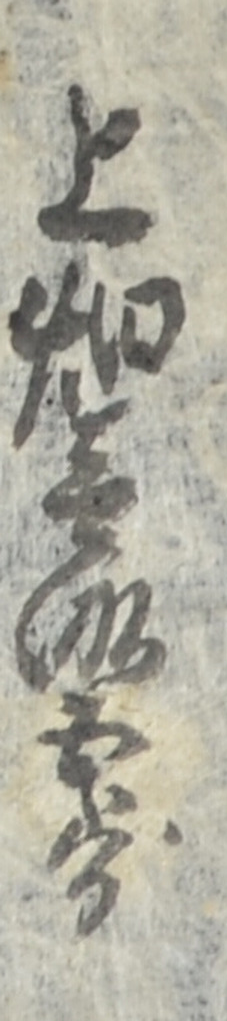上畑壱畝五歩
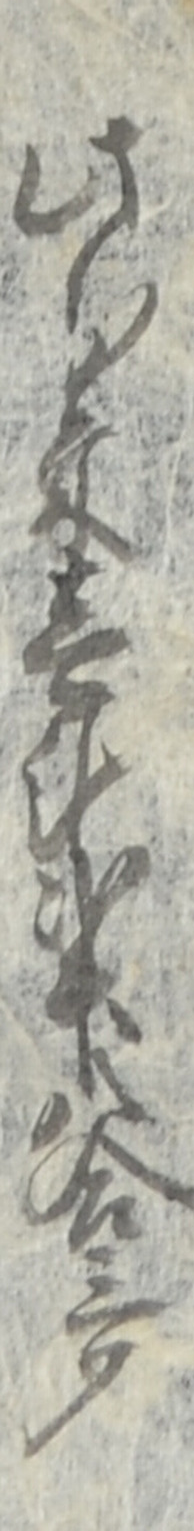此分米壱斗弐升八合三勺
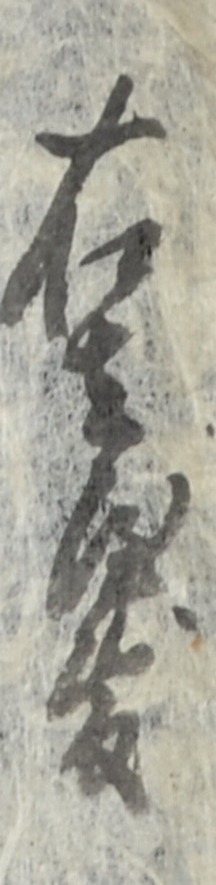右者屋敷
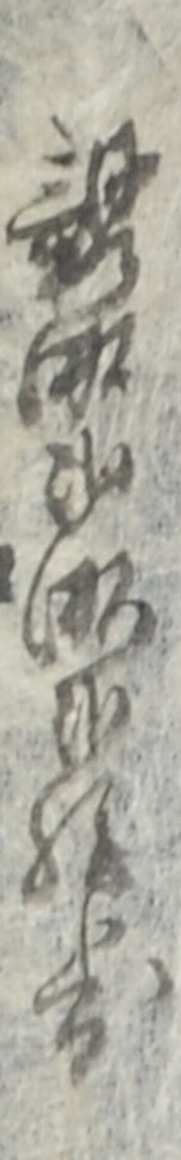親畝弐畝弐拾歩
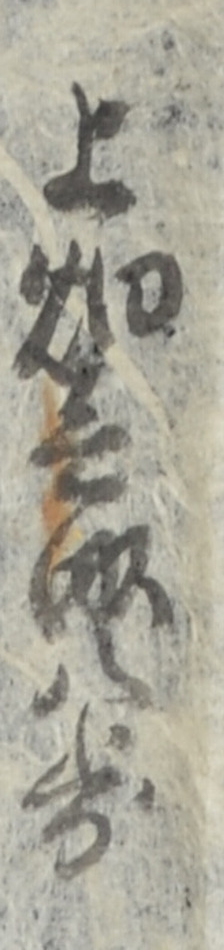上畑壱畝八歩
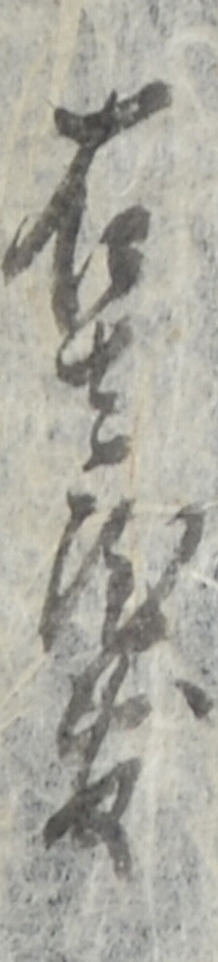右者屋敷
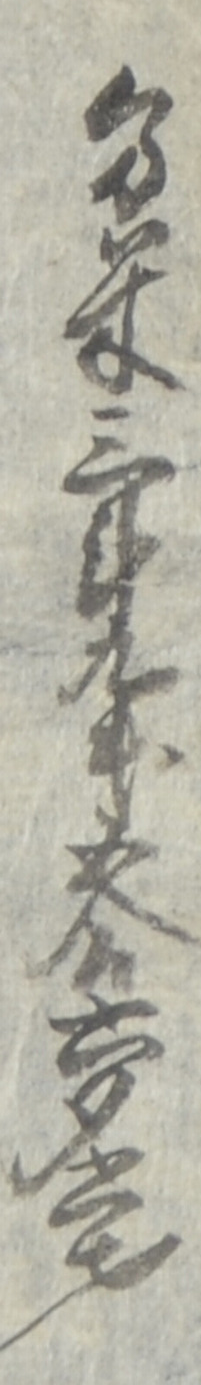分米三斗九升五合六勺六才
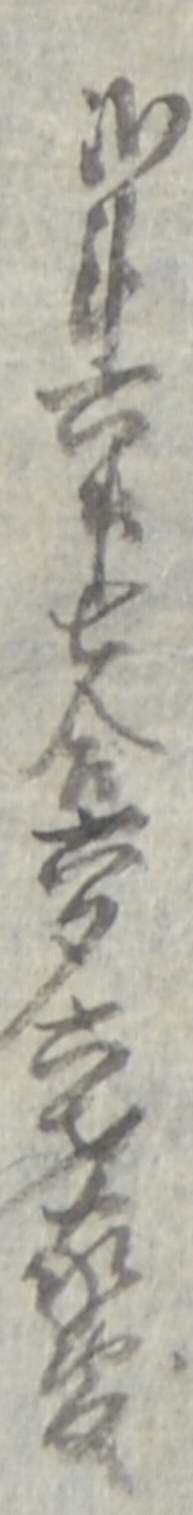弐斗六升七合六勺六才屋敷
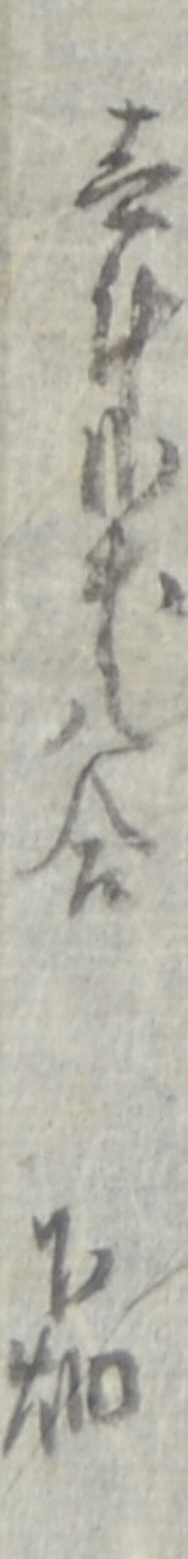壱斗弐升八合下畑
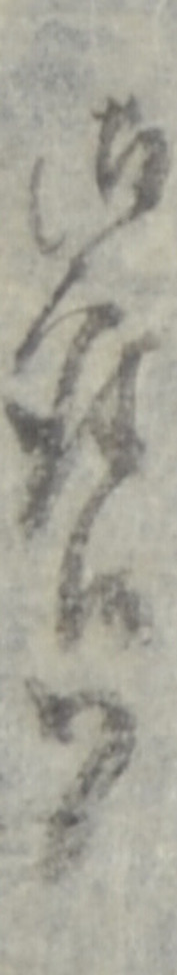御座候以上
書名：鉾持村皆済権現道附替畝歩書付
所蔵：伊那市立高遠町図書館・合同会社AMANE
